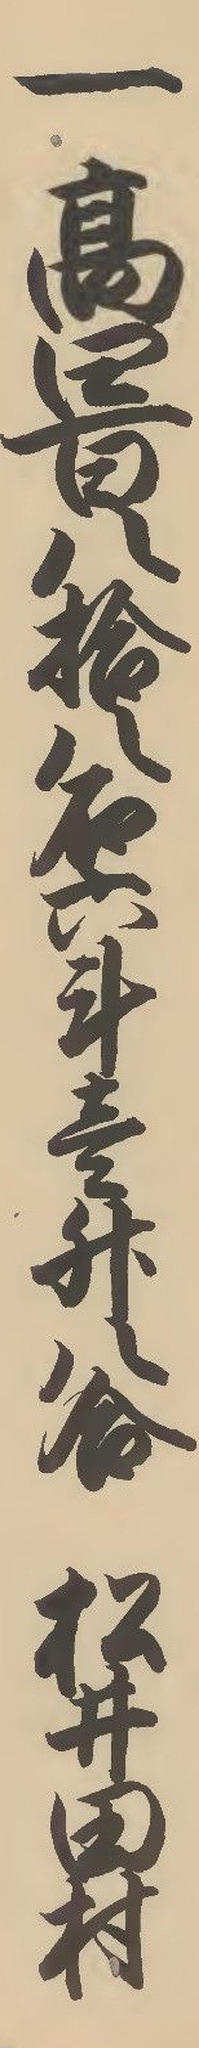一髙四百八拾八石六斗壱升八合松井田村
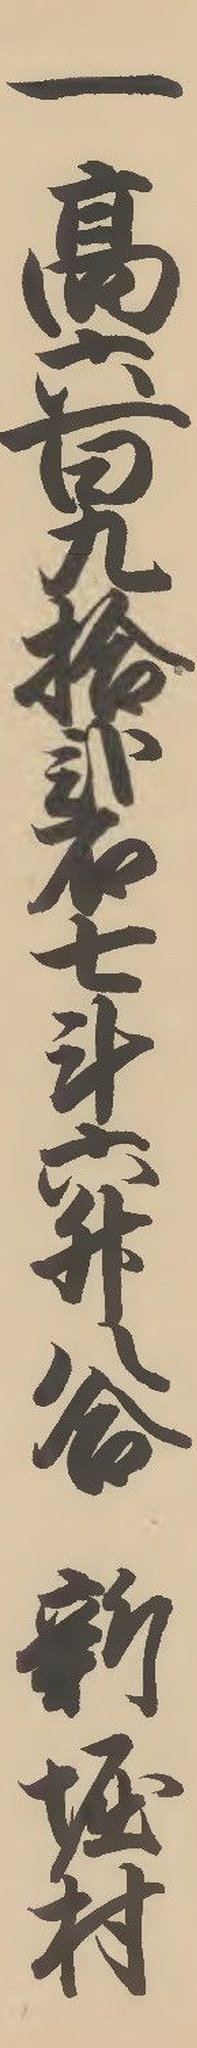一髙六百九拾弐石七斗六升八合新堀村
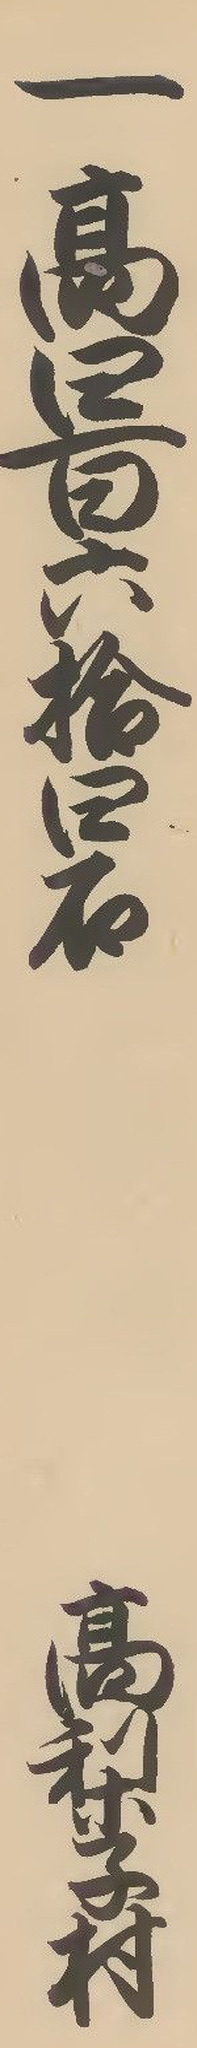一髙四百六拾四石髙梨子村

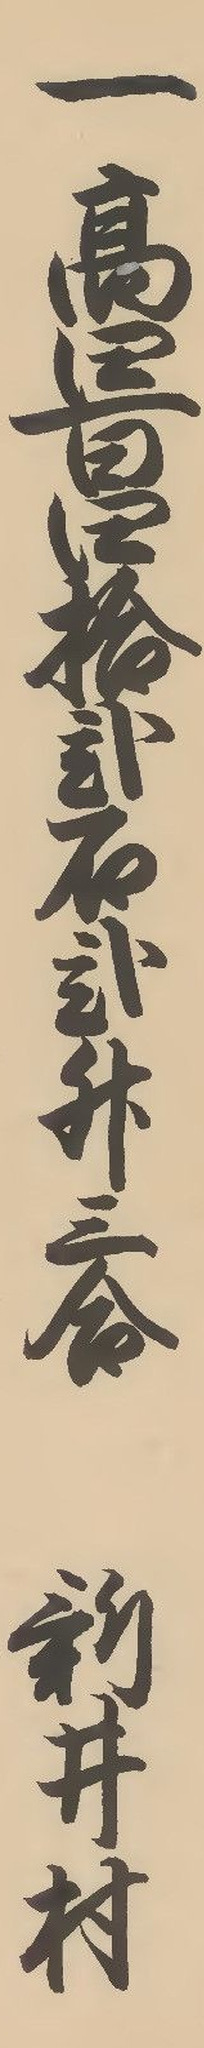一髙四百四拾弐石弐升三合新井村
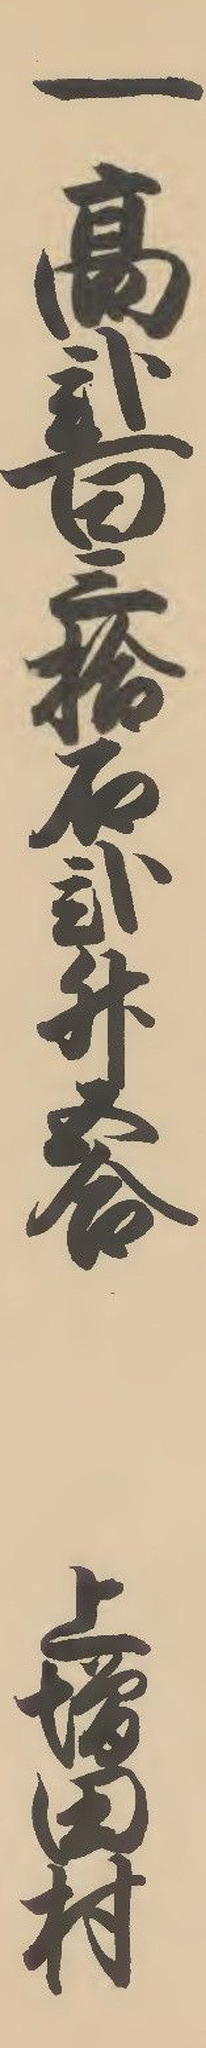一髙弐百三拾石弐升五合上増田村
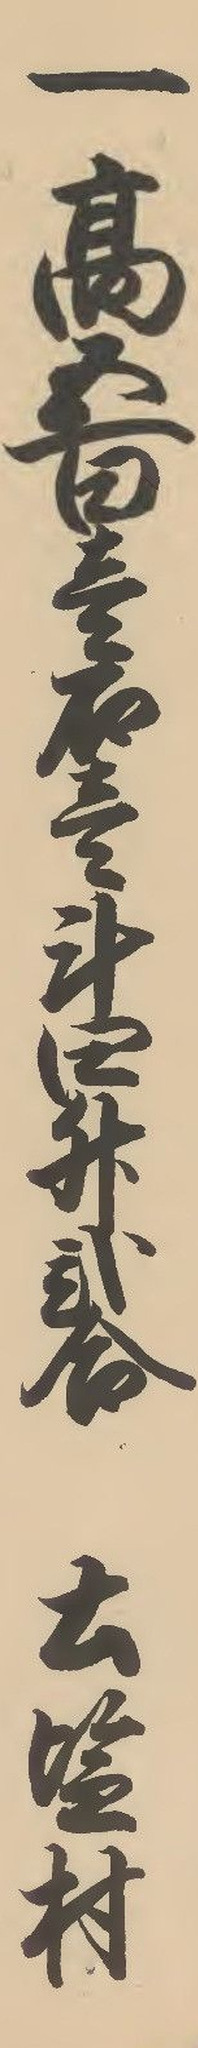一髙五百壱石三斗四升弐合土塩村
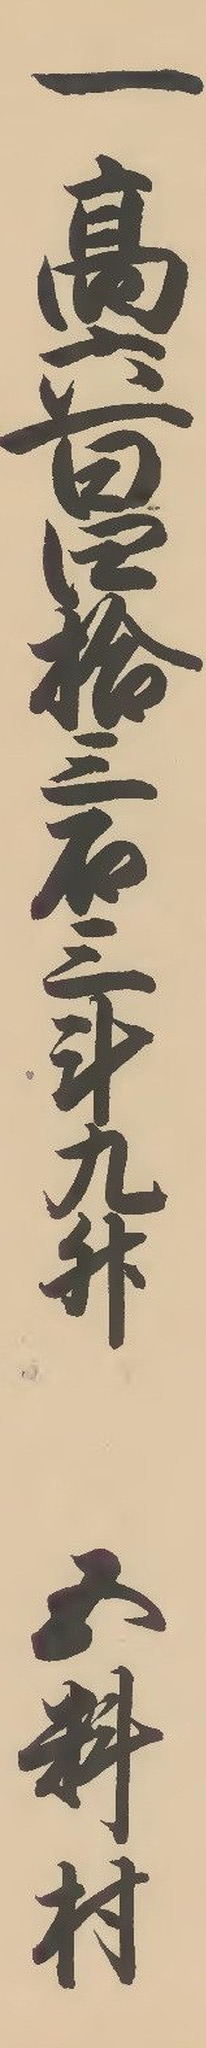一髙六百四拾三石三斗九升五料村
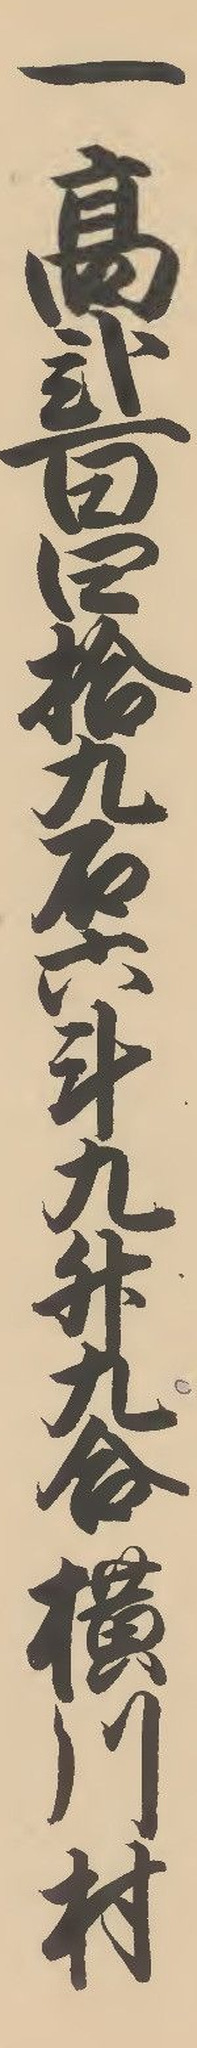一髙弐百四拾九石六斗九升九合横川村
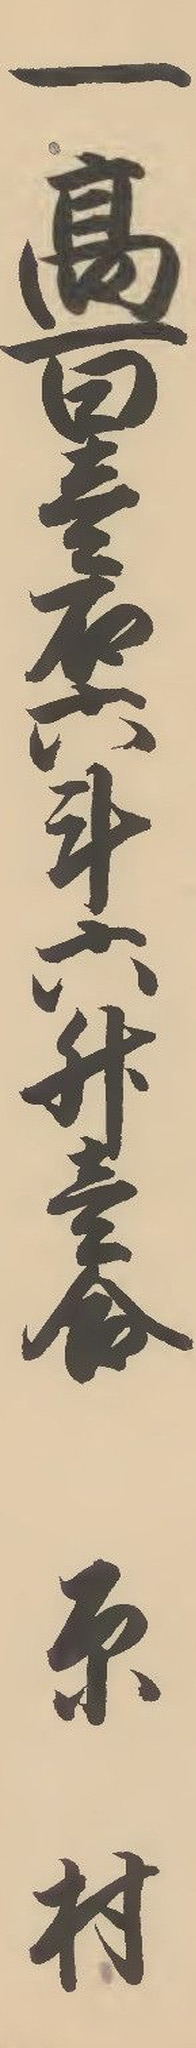一髙百壱石六斗六升壱合原村
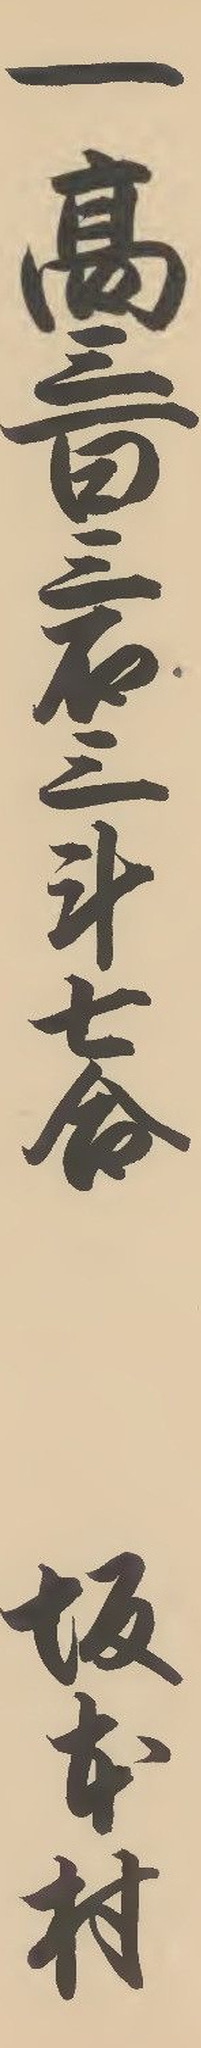一髙三百三石三斗七合坂本村
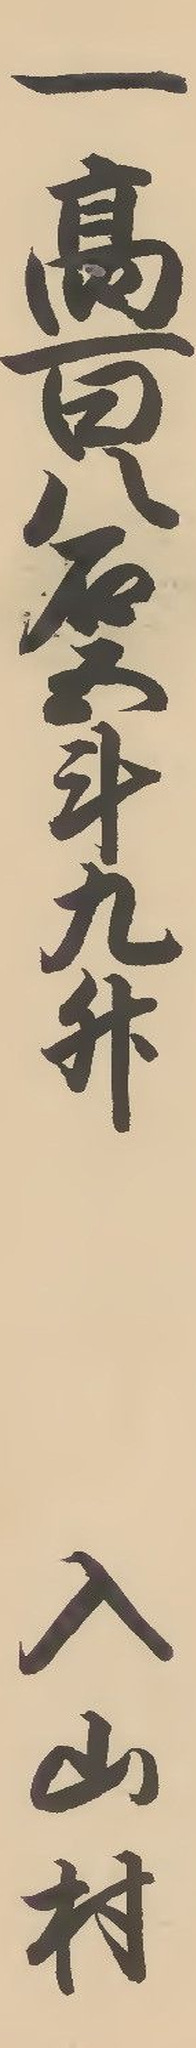一髙百八石五斗九升入山村

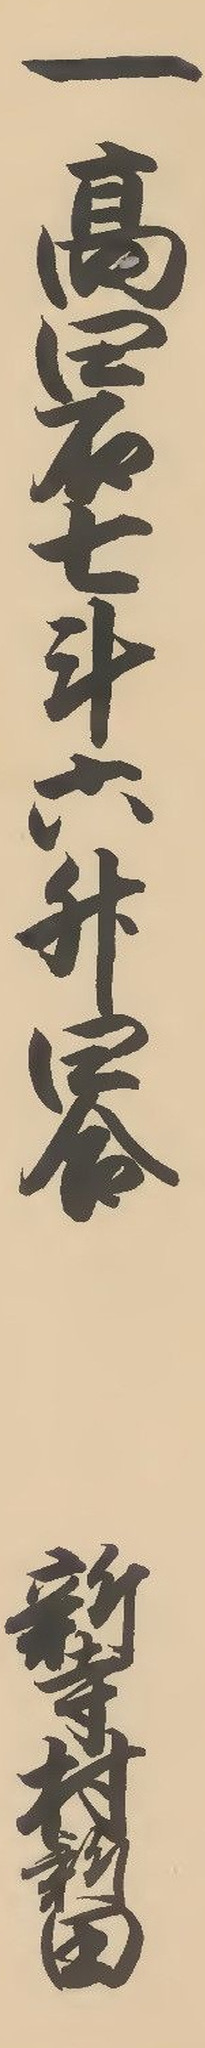一髙四石七斗六升四合新寺村新田
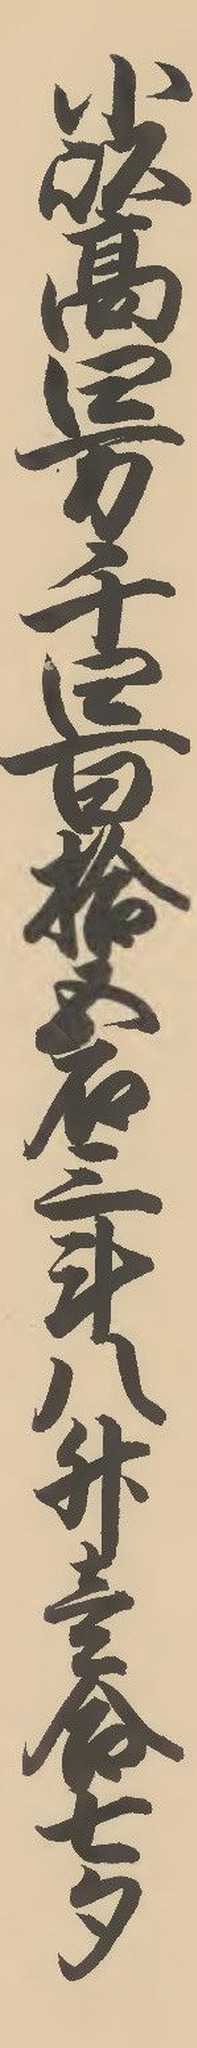小以髙四万千四百拾五石三斗八升壱合七夕
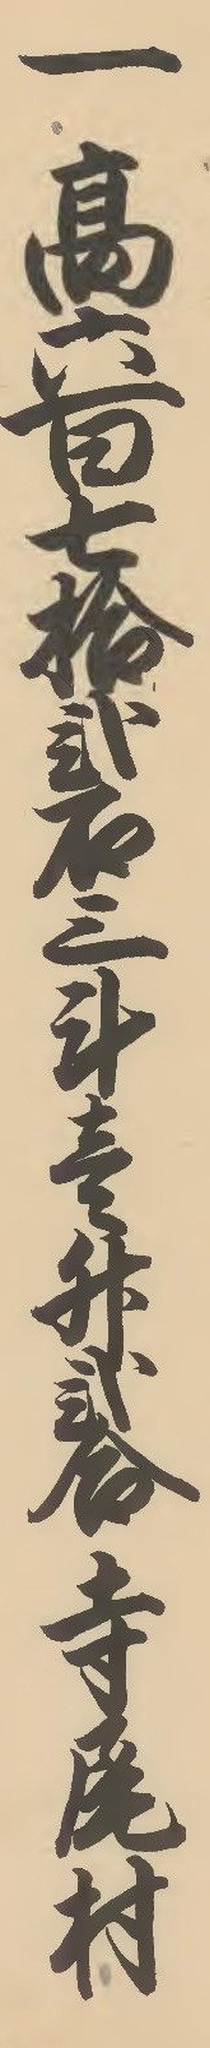一髙六百七拾弐石三斗壱升弐合寺尾村
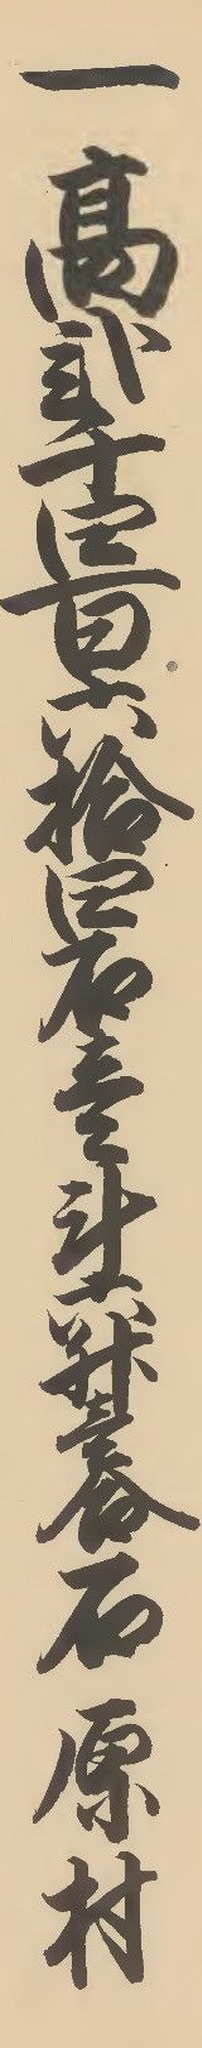一髙弐千四百六拾四石壱斗六升壱合石原村
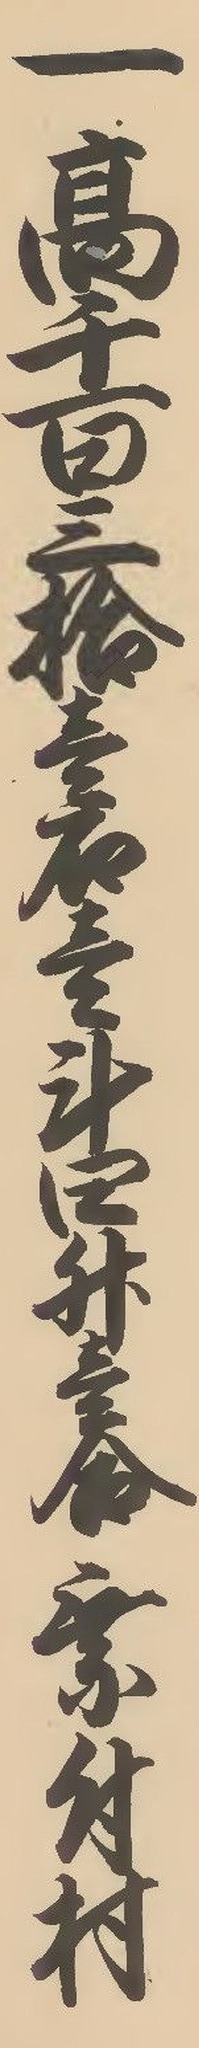一髙千百三拾壱石壱斗四升壱合乗付村
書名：上野国郷帳
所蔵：国立公文書館 National Archives of Japan
